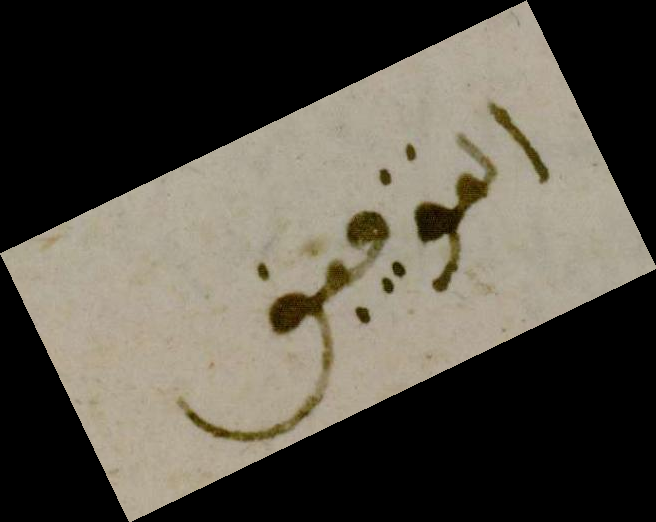التوفيق
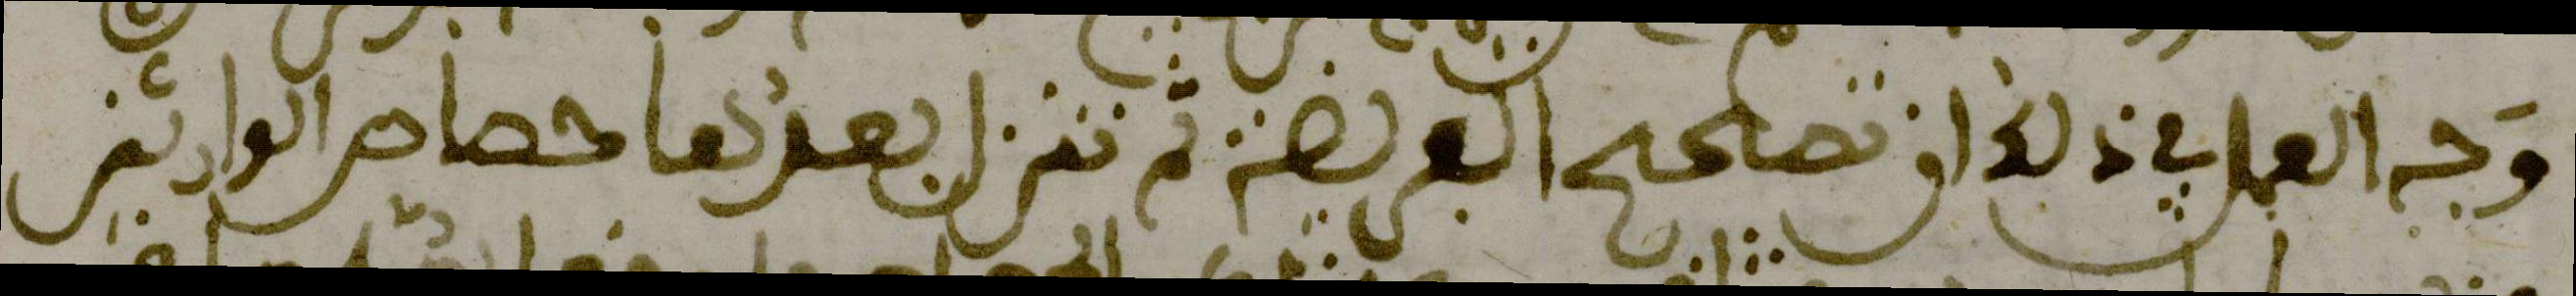وَجه العمل في ذلك ان تصحح الفريضة ثم تنزل بعدها حصاص الوارثين
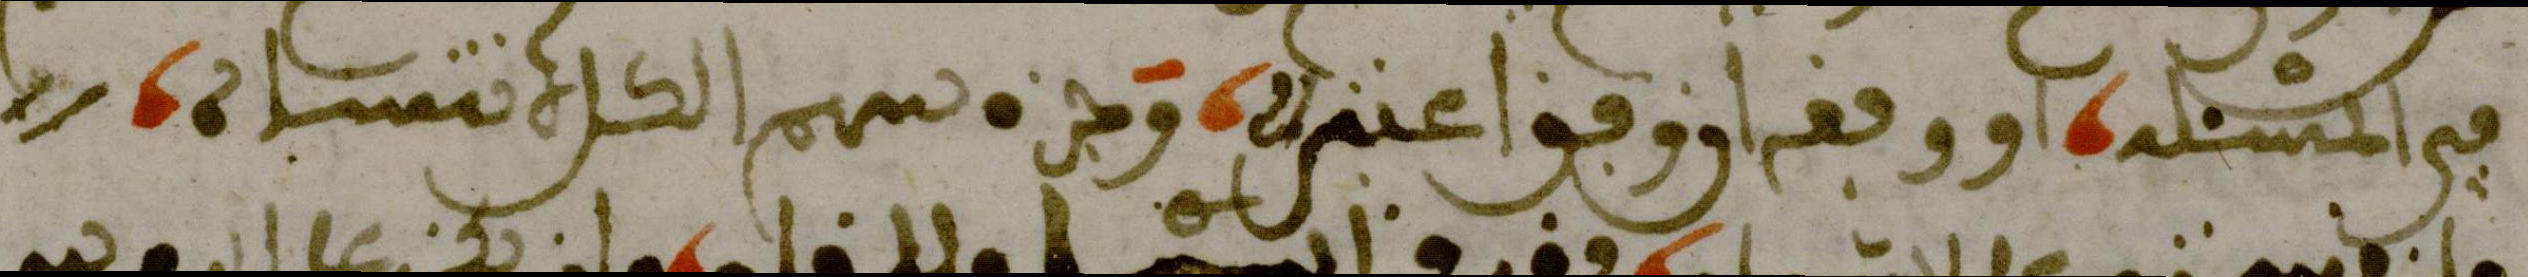في المسْئله او وفقه ان وفق اعتراه وَجزء سهم الكل لا تنساه
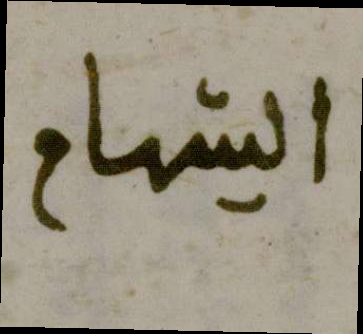السِّهام
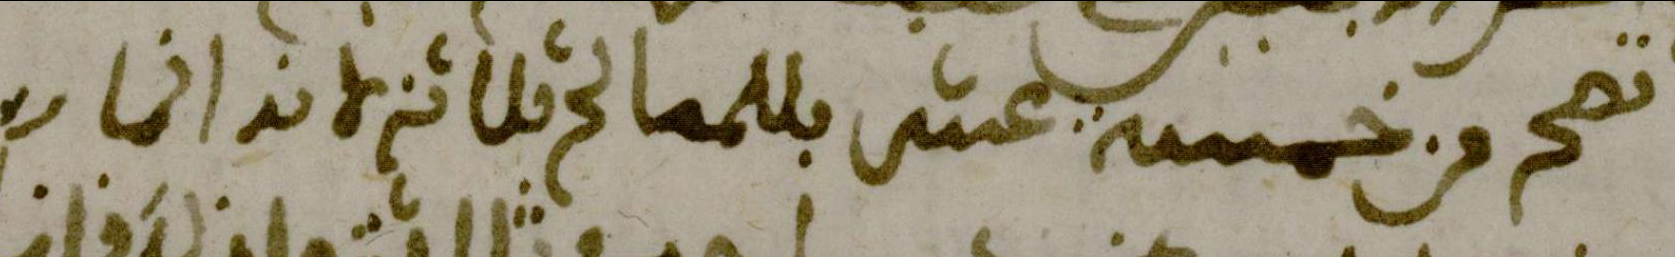تصح من خمسة عشر فللمصالح ثلاثة لانه انما
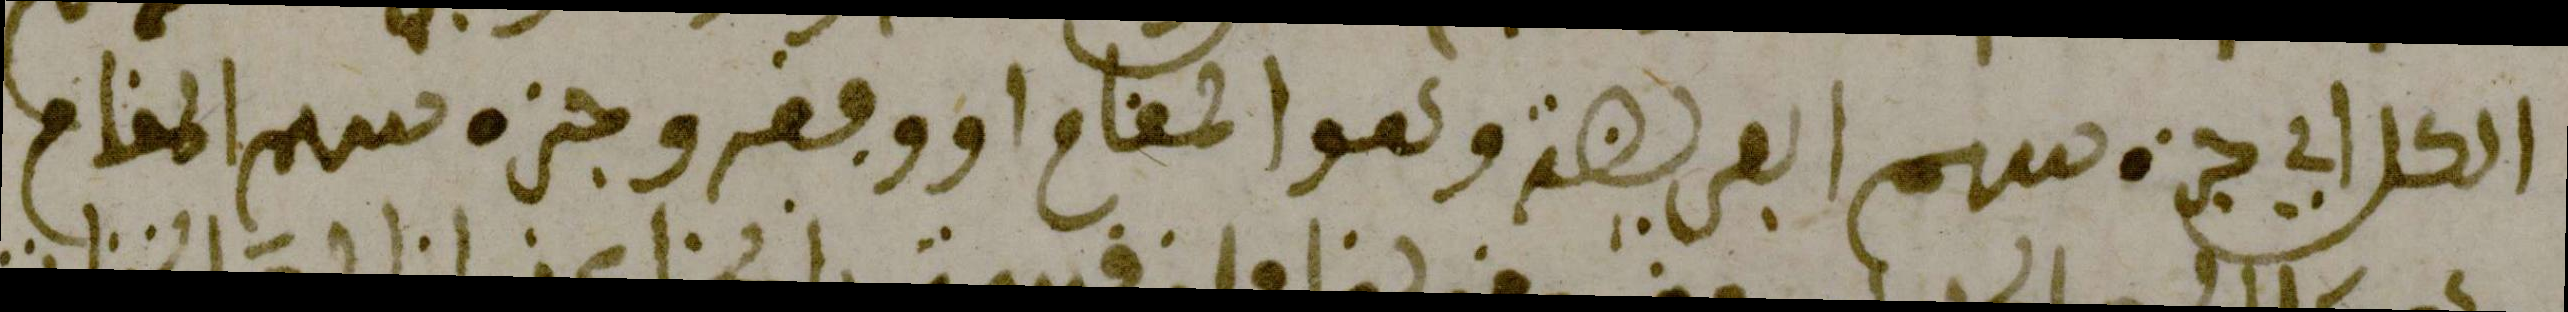الكل اي جزء سهم الفريضة وهو المقام او وفقه وجزء سهم المقام
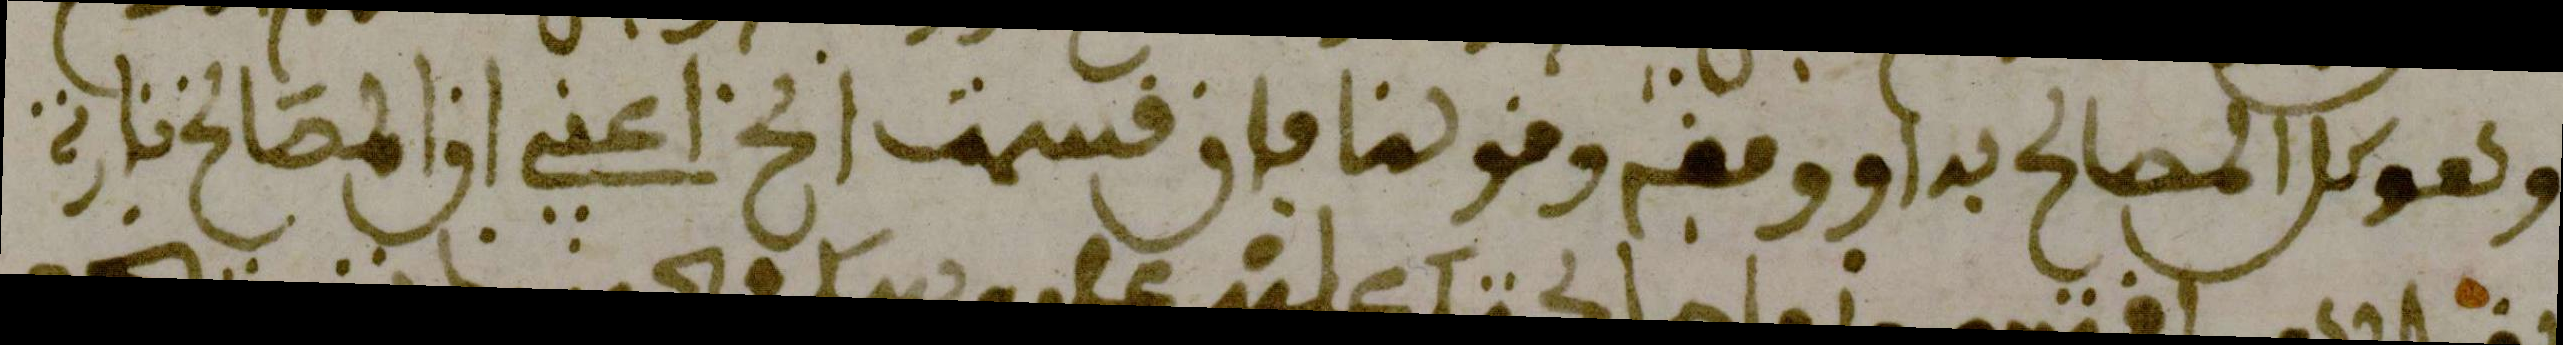وهو كل المصالح به او وفقه وقولنا فان قسمت الخ اعني ان المصَالح تارة
